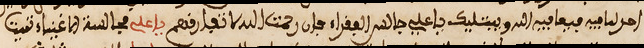احد لما فيه فيعافيه الله ويبتليك يا علي جالس الفقراء فان رحمت الله لا تفارقهم يا على مجالسة الاغنياء تميت
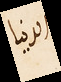الدنيا
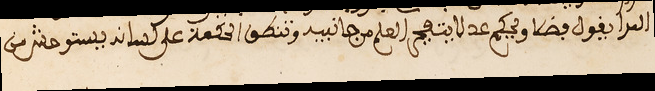المرا يقول فضلا ويحكم عدلا يتفجر العلم من جانبيه وتنطق الحكمة على لسانه يستوحش من
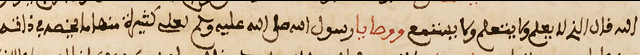الله قال الذي لا يعلم ولا يتعلم ولا يستمع ووصايا رسول الله صلى الله عليه وسلم لعلى كثيرة منها ما يخصه في ذاته
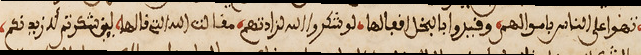تهوا على الناس باموالهم وقيدوا بالنخل اقبالها لو شكروا الله لزادت مقالت الله التي قالها لئن شكرتم لازيدنكم
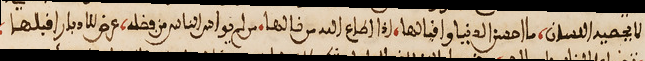لا يحصيه اللسان ما احسن الدنيا واقبالها اذا اطاع الله من نالها من لم يواس الناس من فضله عرض للادبار اقبلها
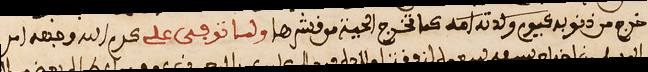خرج من ذنوبه كيوم ولدته امه كما تخرج الحية من قشرها ولما توفى على كرم الله وجهه امر
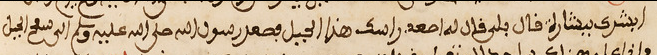ابشرك ببشارة قال بلى قال له اصعد راسك هذا الجبل فصعد رسول الله صلى الله عليه وسلم الى سفح الجبل
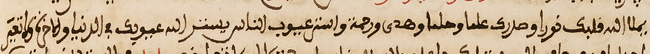يملا الله قلبك نور اوصدرك علما وحلما وهدى ورحمة واستر عيوب الناس يستر الله عيوبك في الدنيا والاخرة ولا تعير
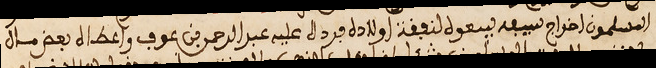المسلمون اخراج سيفه ليعوه لنفقة اولاده قرده عليه عبد الرحمن بن عوف واعطاه بعض مال
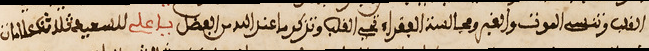القلب وتنسى الموت والقبر ومجالسة الفقراء تحي القلب وتذكر ما عند الله من الفضل يا على للسعيد ثلاثت علامات
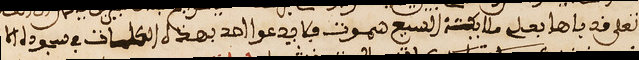تعلى قد باها بعلى ملايكتة السيع سموت فلا يدعوا احد بهذه الكلمات في سجوده الا
